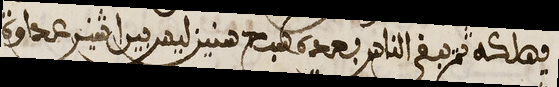يهلكه ثم يبقى الناس بعده سبع سنين ليس بين اثنين عداوة
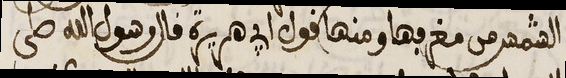الشمس من مغربها ومنها قول ابي هريرة قال رسول الله صلى
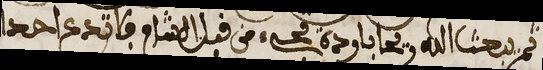ثم يبعث الله ريحا باردة تجيء من قبل الشام فلا تدع احدا
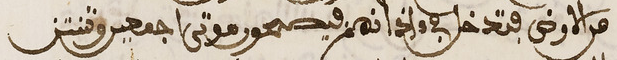من الأرض فتدخل في ءاذانهم فيصبحون موتى اجمعين وتنتن
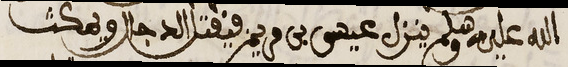الله عليه وسلم ينزل عيسى بن مريم فيقتل الدجال ويمكث
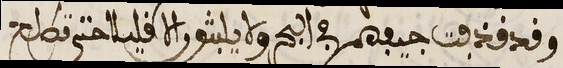وقد قدفت جيفهم في البحر ولا يلبثون الا قليلا حتى تطلع
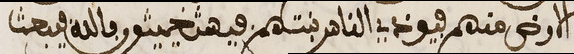الأرض منهم فيوذي الناس نبتهم فيسثغييثون بالله فيبعث
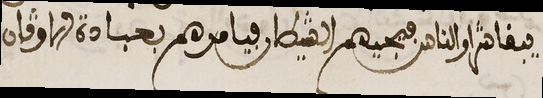يبقا شرا والناس فيجيهم الشيطان فيامرهم بعبادة الاوثان
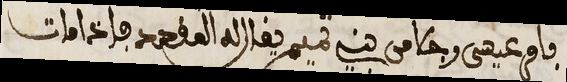بامر عيسى رجلا من بني تميم يقال له المقعد فاذا مات
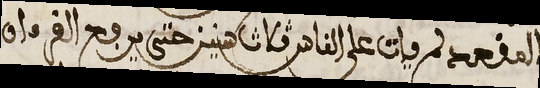المقعد لم يات على الناس ثلاث سنين حتى يرفع القرءان
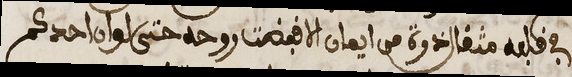في قلبه مثقال ذرة من ايمان الا قبضت روحه حتى لو ان احدكم
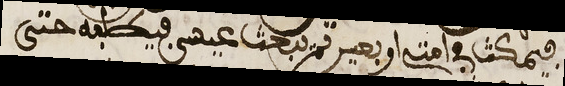فيمكث في امتي اربعين ثم يبعث عيسى فيطلبه حتى
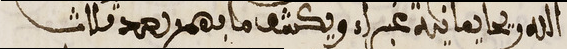الله ريحا يمانية غبراء ويكشف ما بهم بعد ثلاث
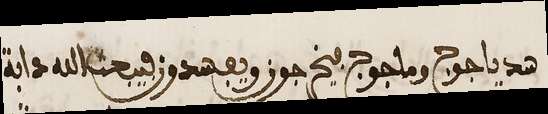سد ياجوج وماجوج فيخرجون ويفسدون فيبعث الله دابة
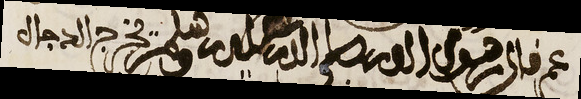عمر قال رسول الله صلى الله عليه وسلم يخرج الدجال
